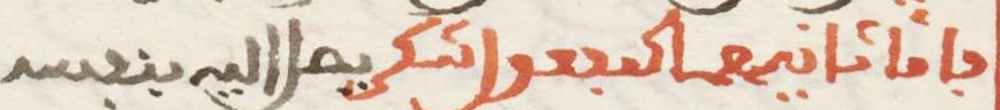فاما ثانيهما كمفعول شكر يصل اليه بنفسه
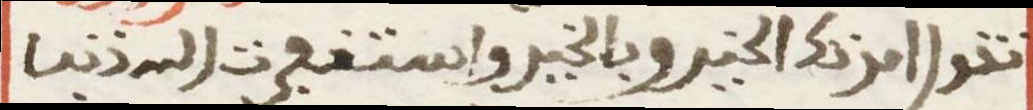تقول امرتك الخير وبالخير واستغفرت اليه ذنبا
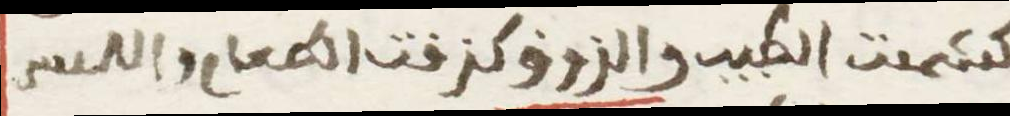كشممت الطيب والذوق كذقت الطعام واللمس
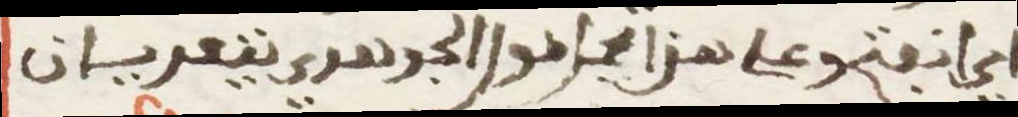اي انفتح وعلى هذا يحمل قول الجوهري يتعديان
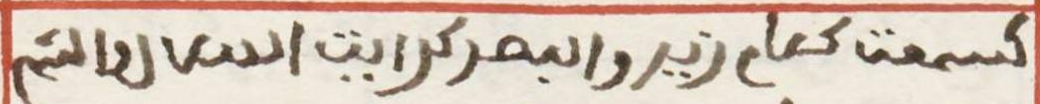كسمعت كلام زيد والبصر كرايت الهلال والشم
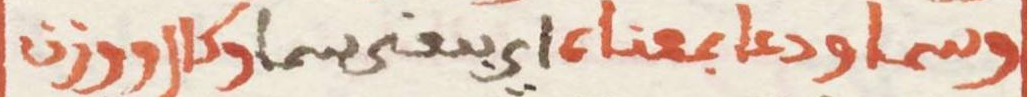وسما ودعا بمعناه اي بمعنى سما وكال ووزن
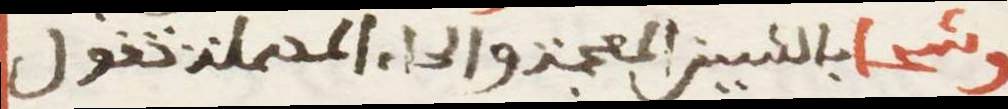وشحا بالشين المعجمة والحاء المهملة تقول
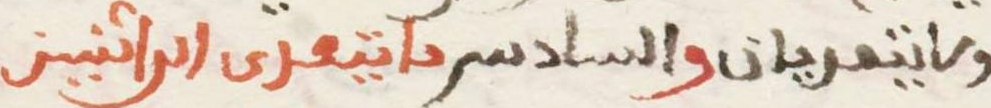ولا يتعديان والسادس ما يتعدى الى اثنين
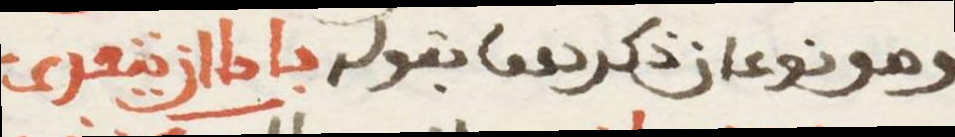وهو نوعان ذكرهما بقوله فاما ان يتعدى
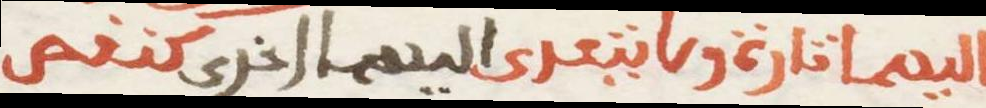اليهما تارة ولا يتعدى اليهما اخرى كنقص
